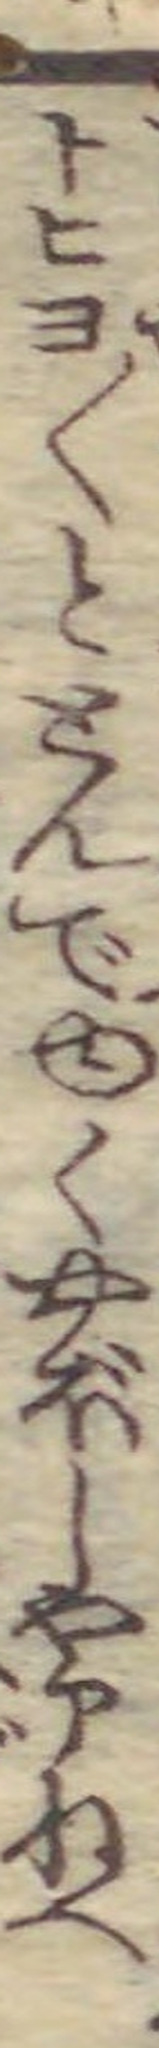トヒヨ〳〵ととんでゆくやぼしやァねへ
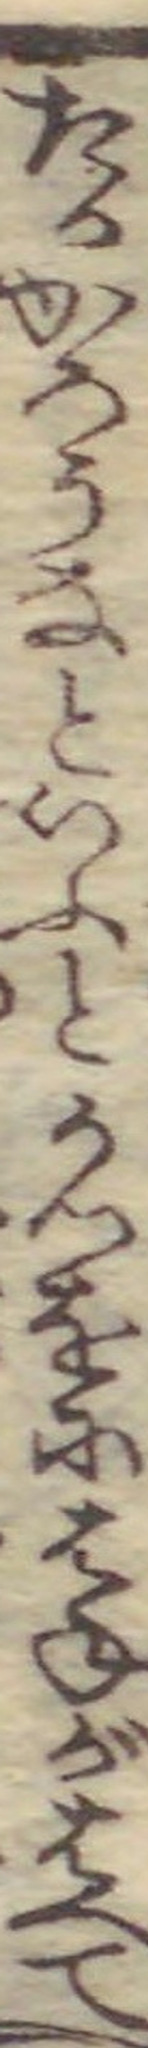たかかろうなといふとかつをにはねがはへて
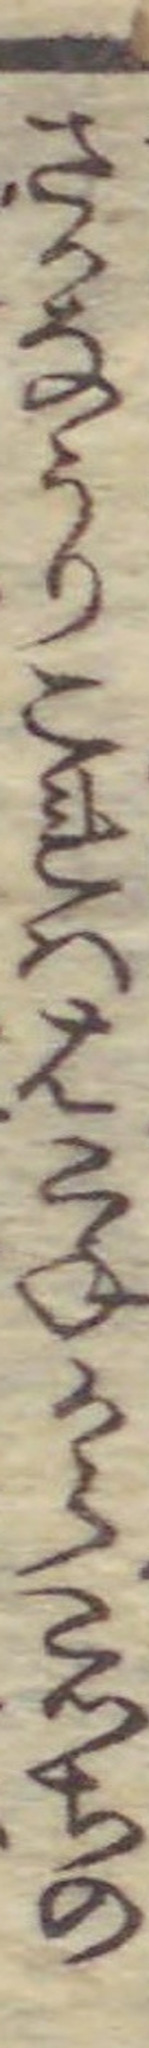さかなうりこれははこねからこつちの
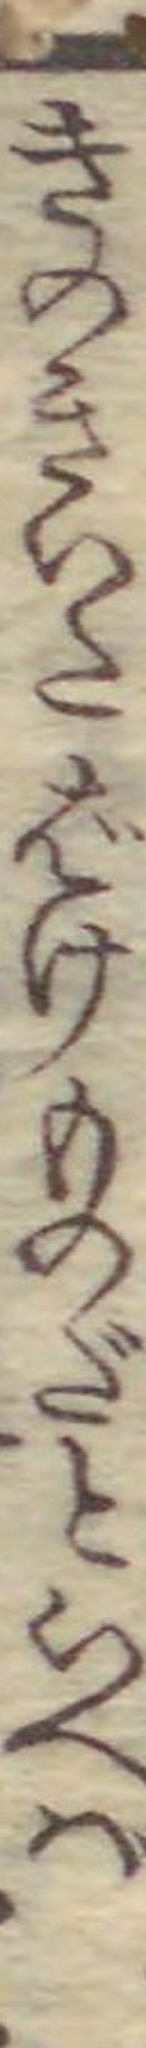きのきいたばけものだといへば
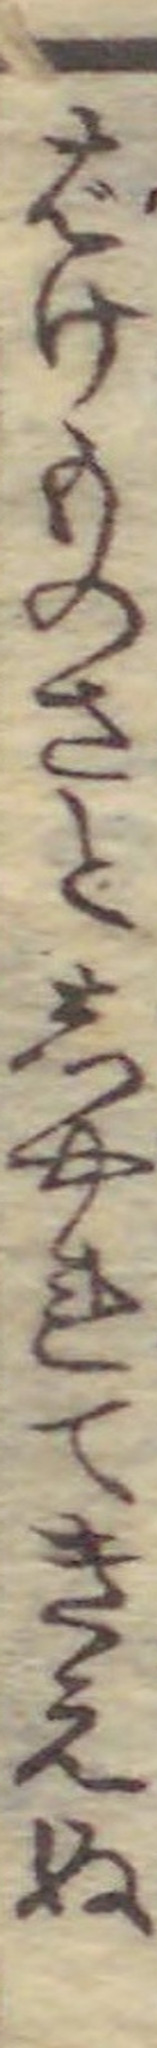ばけものさとしやれてきえぬ

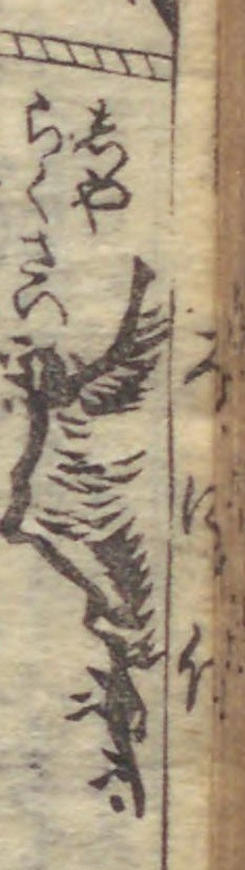らくさい
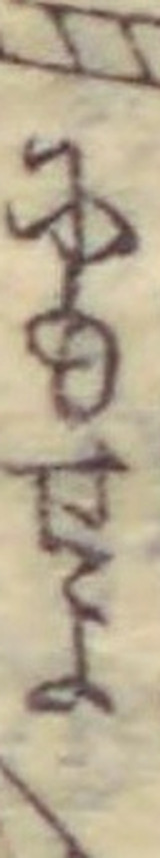にもせよ
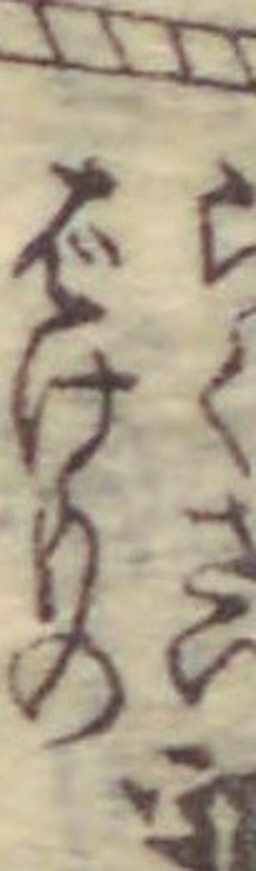ばけもの
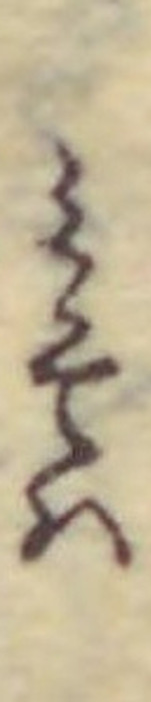みそは
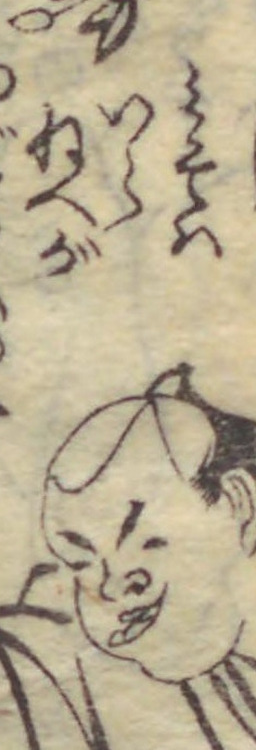ねへが
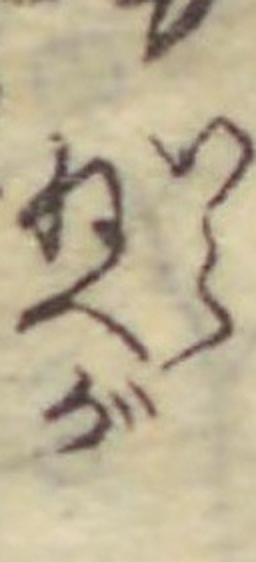ねへが
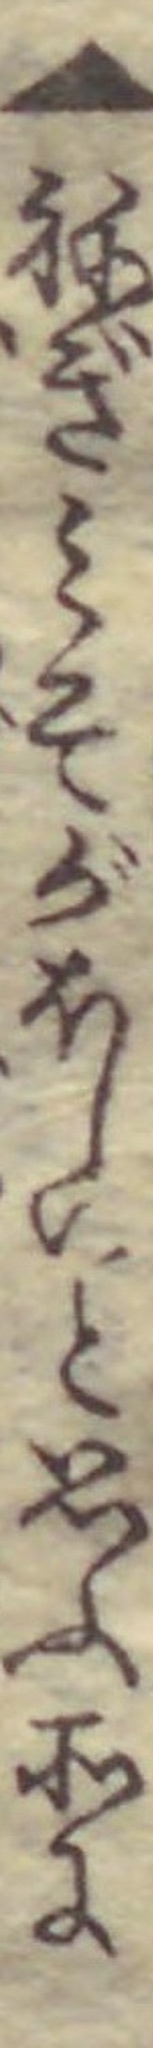▲ねぎみそがほしいと思ふ所に
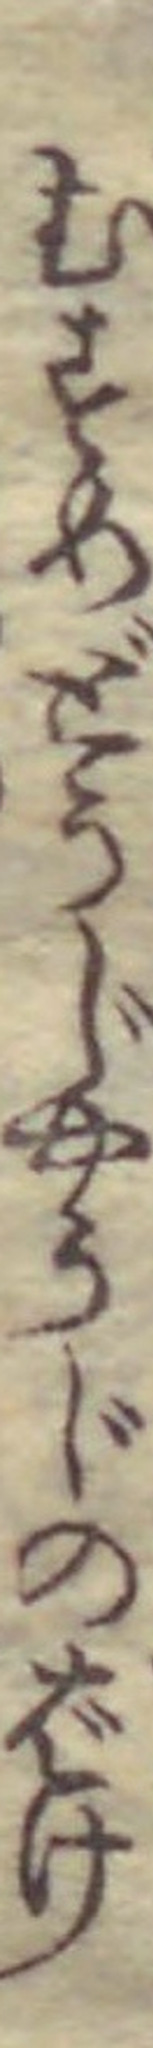むすめどうじやうじのばけ
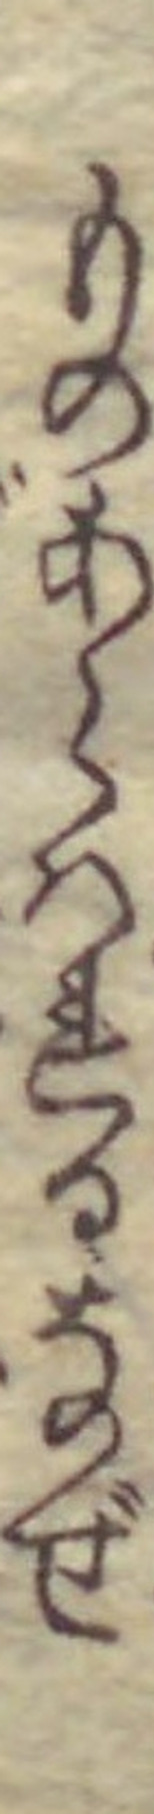ものあらはれるなぜ
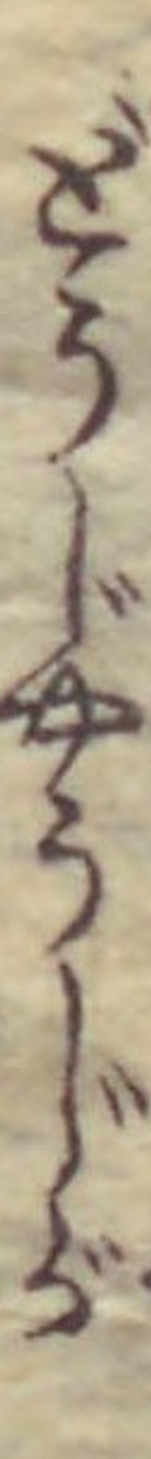どうしやうじが
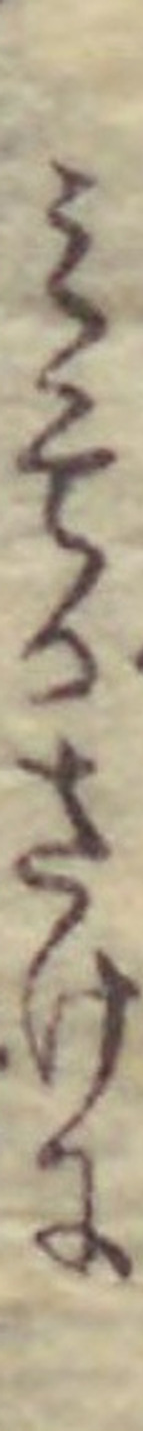みそかさけに
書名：大時代唐土化物 3巻. 曽我太夫染
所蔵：国立国会図書館 National Diet Library, JAPAN
